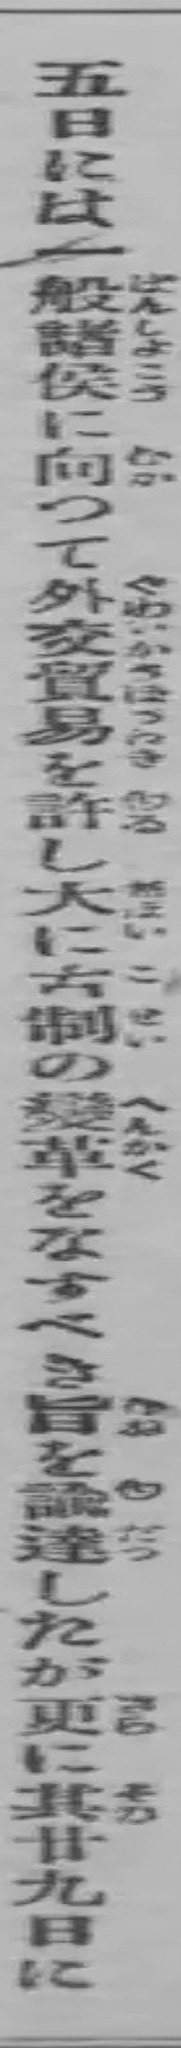五日には一般諸侯に向つて外交貿易を許し大に古制の変革をなすべき旨を諭達したが更に其廿九日に
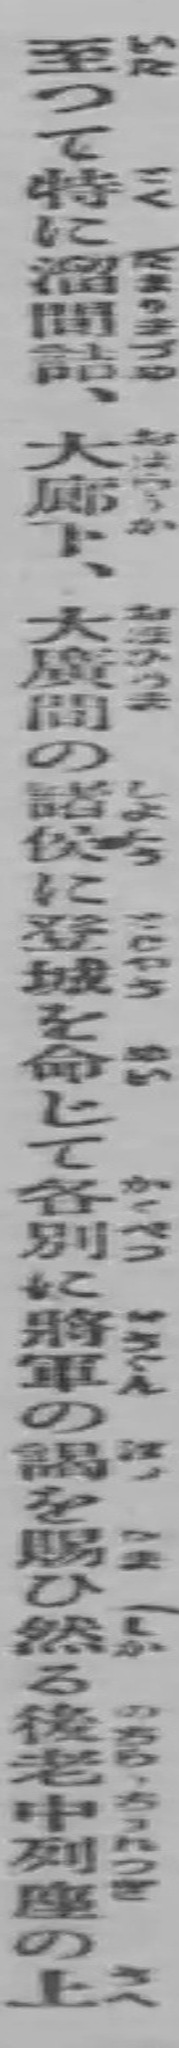至つて特に溜間詰、大廊下、大広間の諸侯に登城を命じて各別に将軍の謁を賜ひ然る後老中列座の上
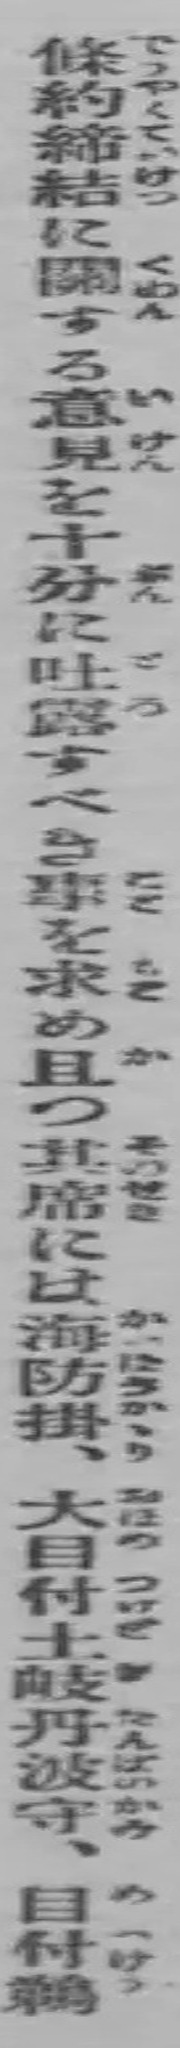条約締結に関する意見を十分に吐露すべき事を求め且つ其席には海防掛、大目付土岐丹波守、目付鵜
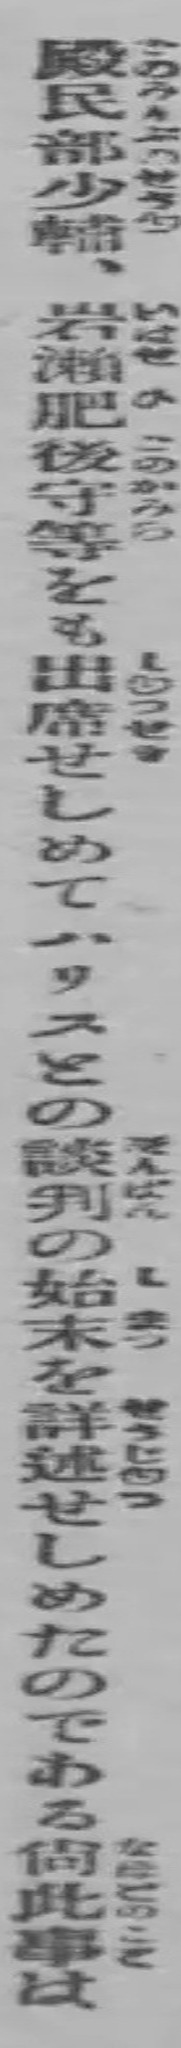殿民部少輔、岩瀬肥後守等をも出席せしめてハリスとの談判の始末を詳述せしめたのである尚此事は
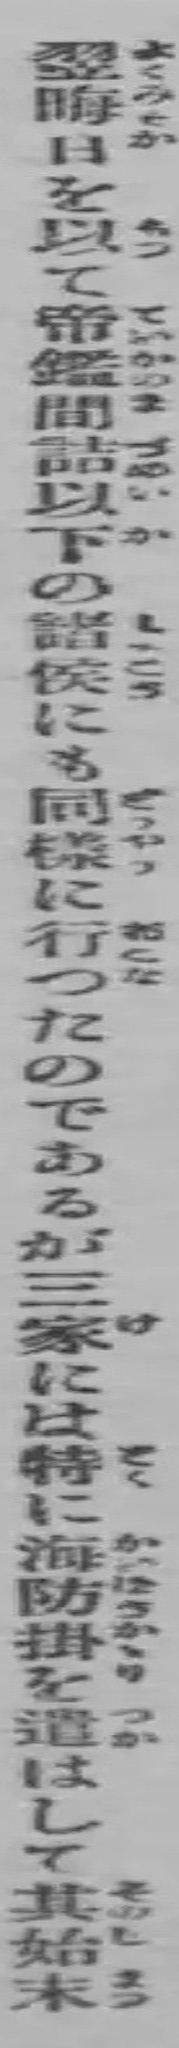翌晦日を以て帝鑑間詰以下の諸侯にも同様に行つたのであるが三家には特に海防掛を遣はして其始末
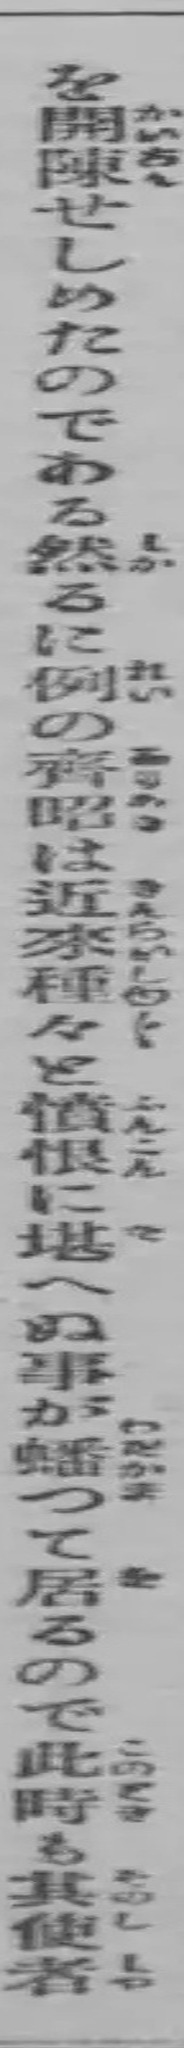を開陳せしめたのである然るに例の斉昭は近来種々と憤恨に堪へぬ事が蟠つて居るので此時も其使者
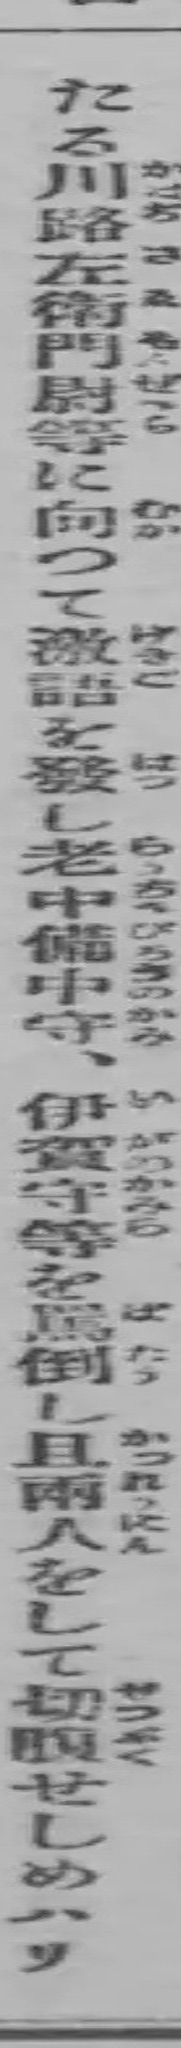斉昭の放言たる川路左衛門尉等に向つて激語を発し老中備中守、伊賀守等を罵倒し且両人をして切腹せしめハリ
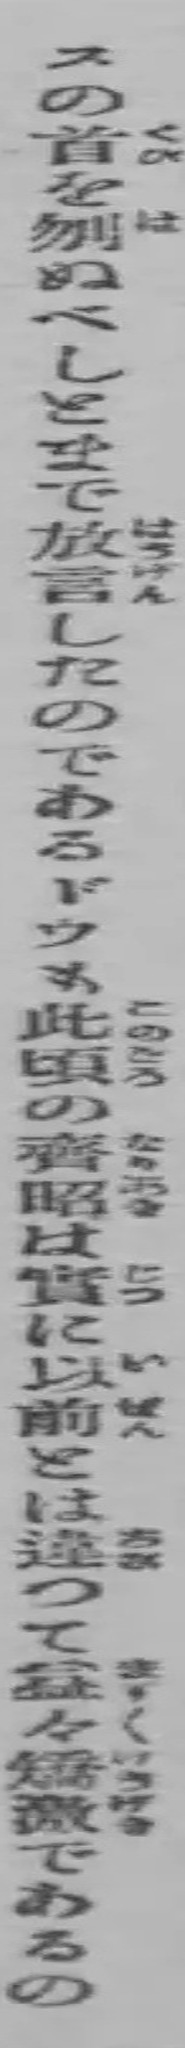スの首を刎ぬべしとまで放言したのであるドウも此頃の斉昭は実に以前とは違つて益々矯激であるの
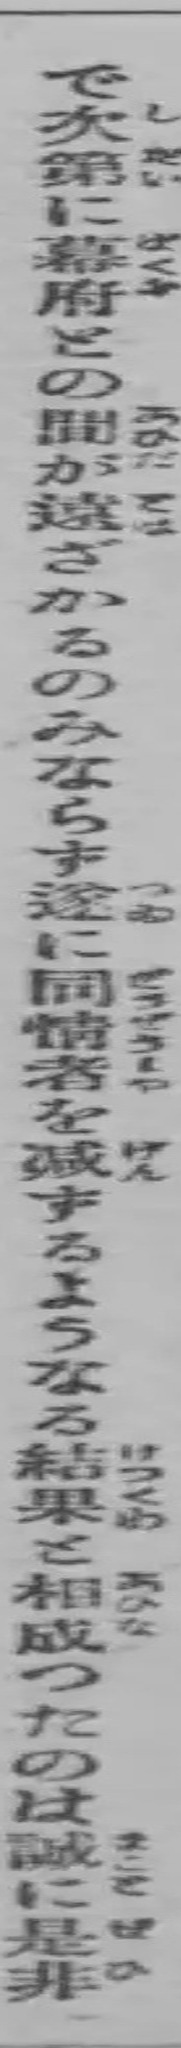で次第に幕府との間が遠ざかるのみならず遂に同情者を減ずるようなる結果と相成つたのは誠に是非
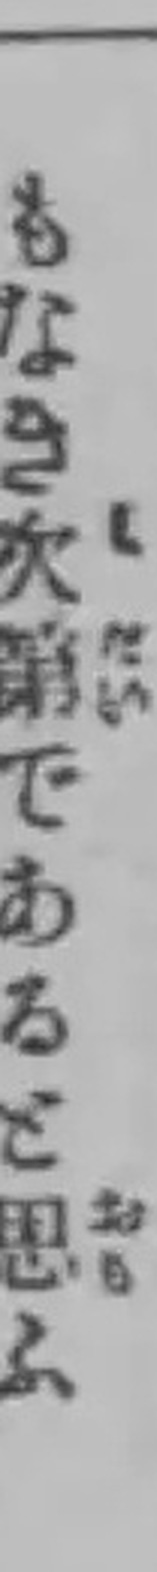もなき次第であると思ふ
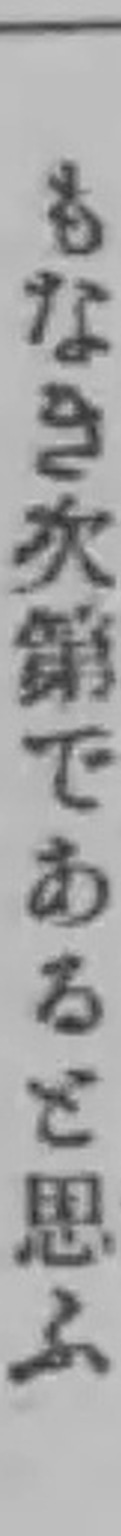もなき次第であると思ふ
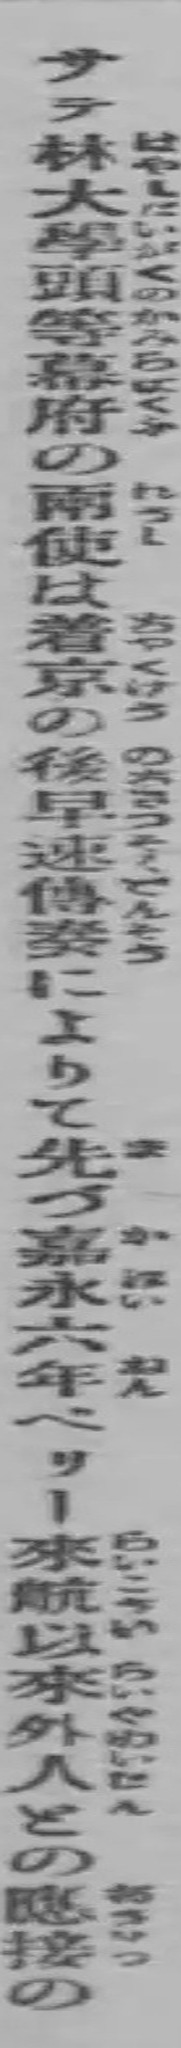サテ林大学頭等幕府の両使は着京の後早速伝奏によりて先づ嘉永六年ペリー来航以来外人との応接の
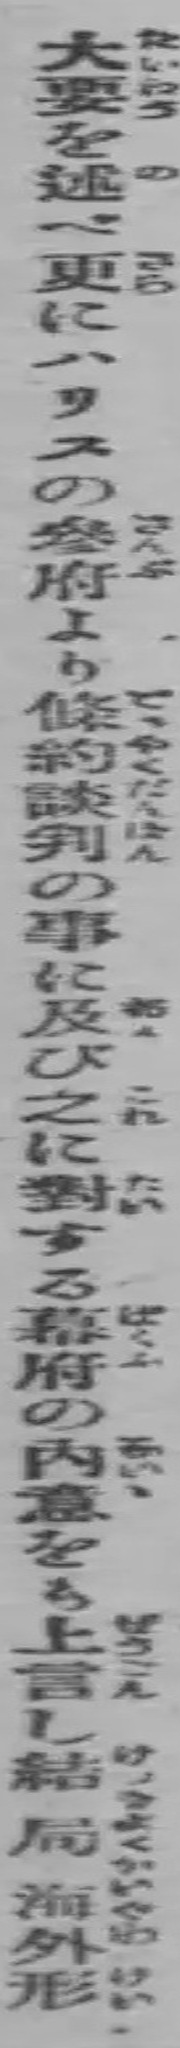大要を述べ更にハリスの参府より条約談判の事に及び之に対する幕府の内意をも上言し結局海外形

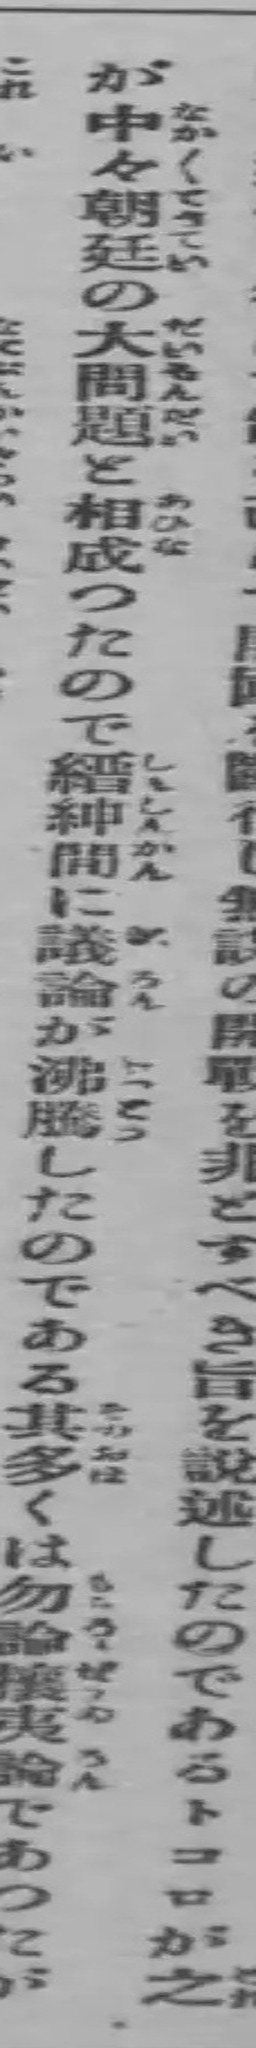が中々朝廷の大問題と相成つたので縉紳間に議論が沸騰したのである其多くは勿論攘夷論であつたが
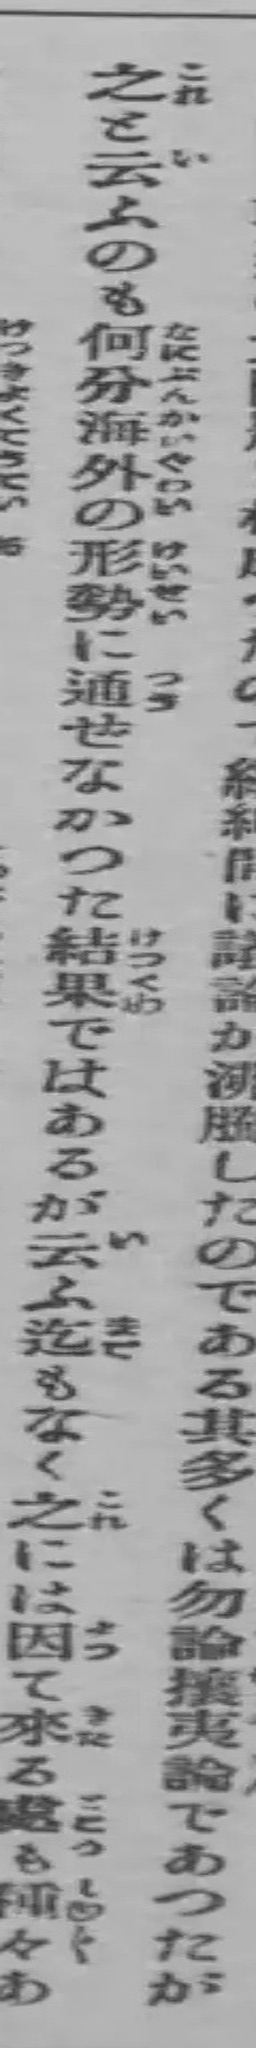之と云ふのも何分海外の形勢に通ぜなかつた結果ではあるが云ふ迄もなく之には因て来る処も種々あ
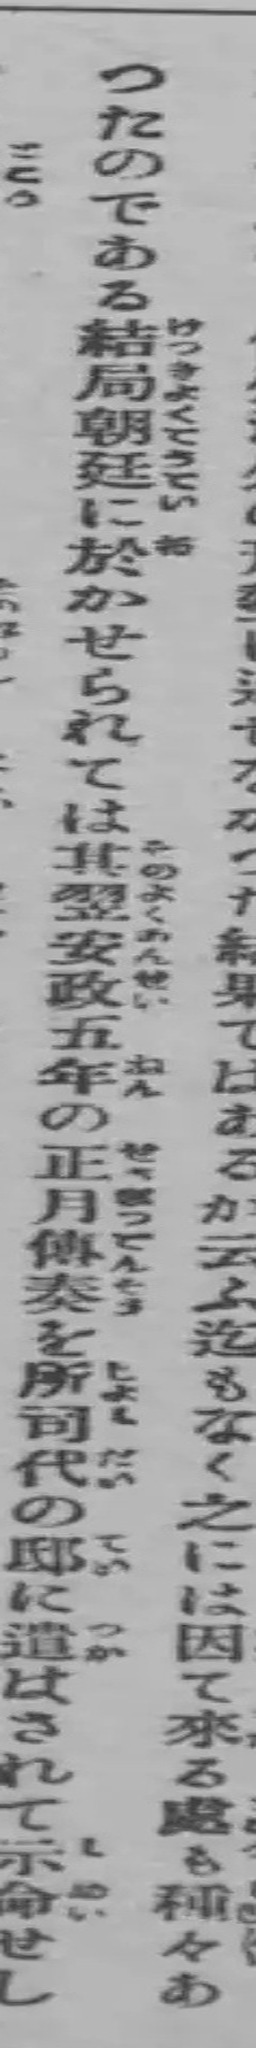つたのである結局朝廷に於かせられては其翌安政五年の正月伝奏を所司代の邸に遣はされて示命せし
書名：豊橋市史談
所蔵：国立国会図書館 National Diet Library, JAPAN
